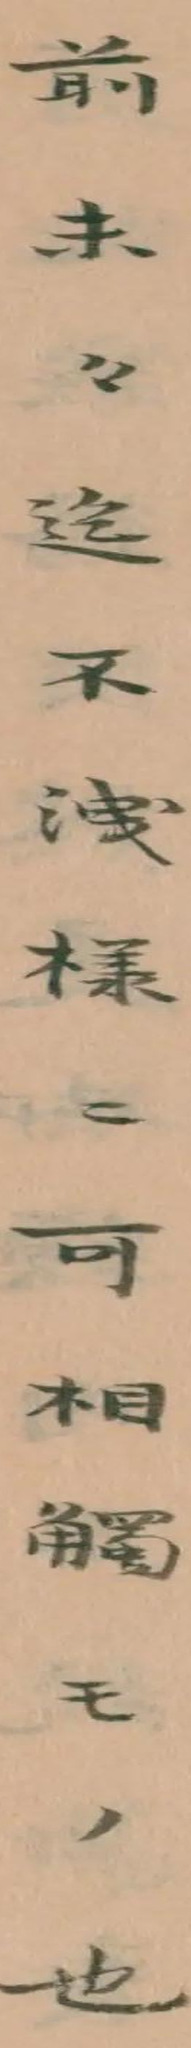前末々迄不洩様ニ可相触モノ也
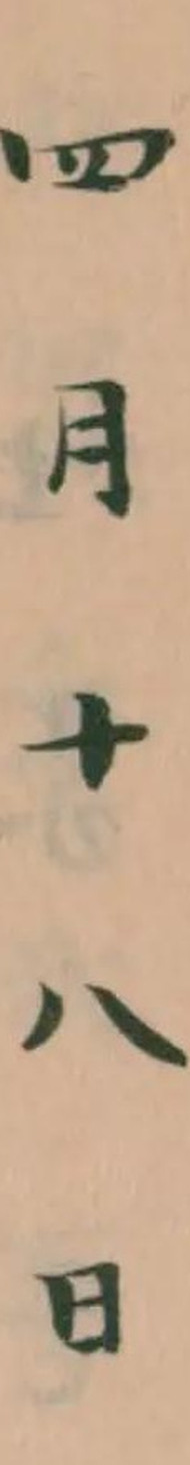四月十八日
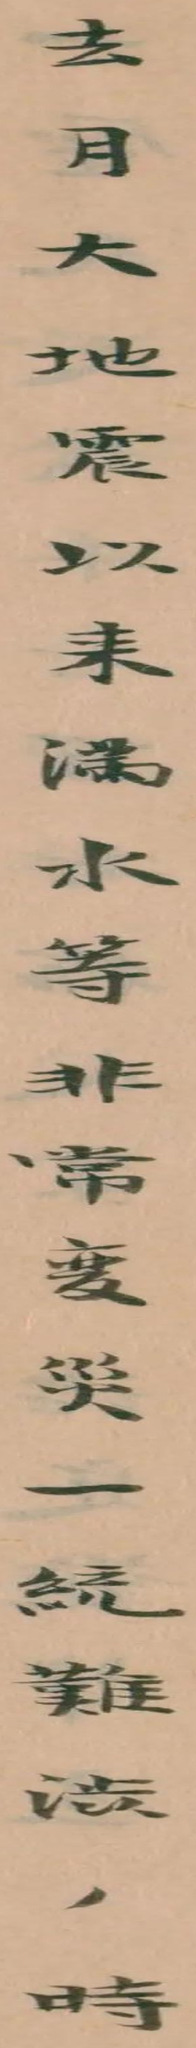去月大地震以来満水等非常変災一統難渋ノ時
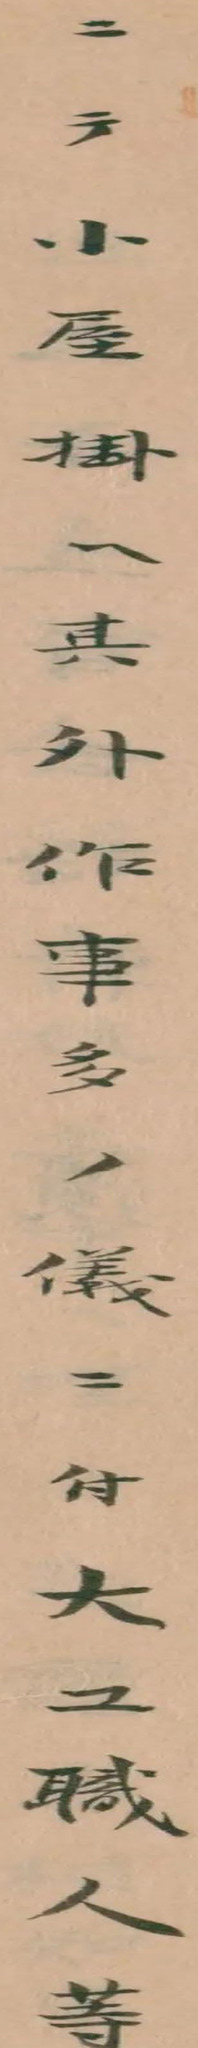ニテ小屋掛ヘ其外作事多ノ儀ニ付大工職人等
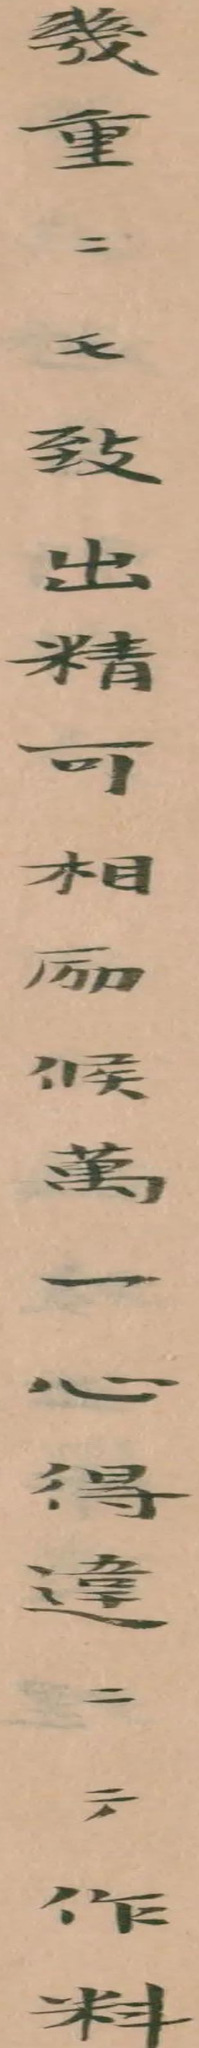幾重ニモ致出精可相励候萬一心得違ニテ作料
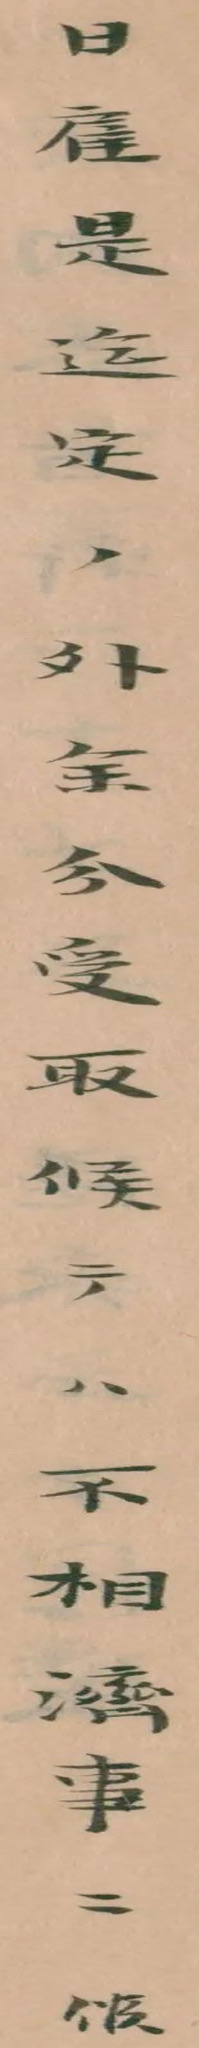日雇是迄定ノ外余分受取候テハ不相済事ニ候
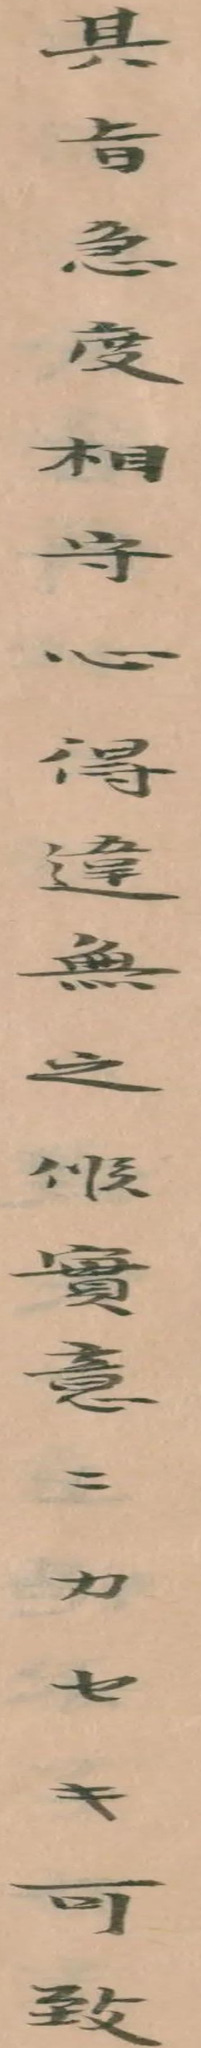其旨急度相守心得違無之候実意ニカセキ可致
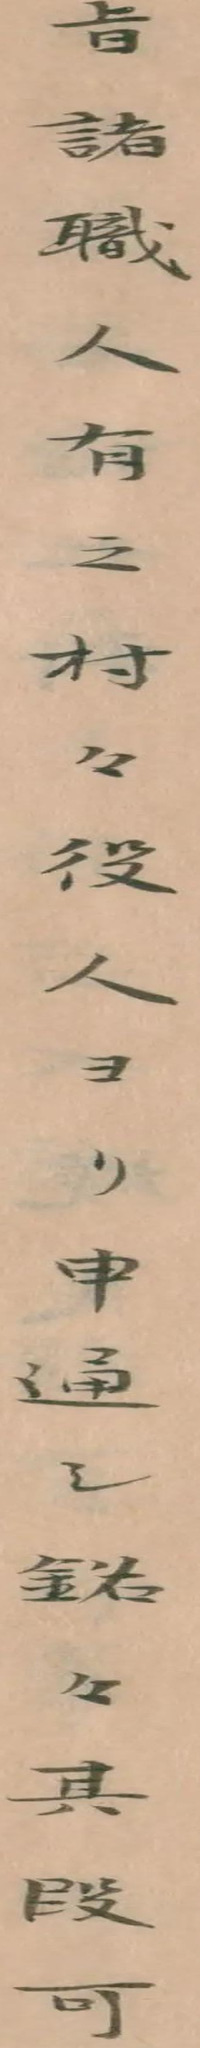旨諸職人有之村々役人ヨリ申通シ銘々其段可
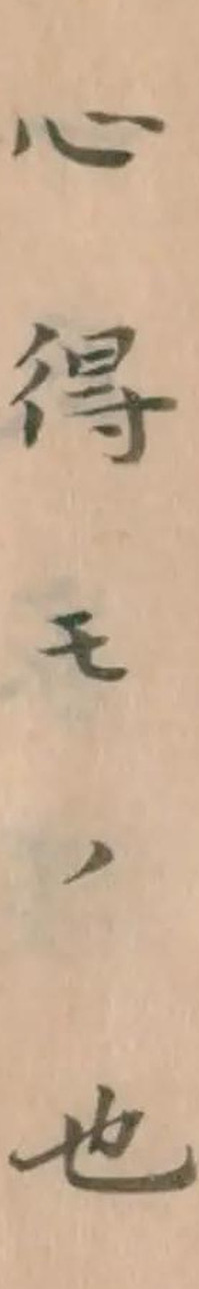心得モノ也
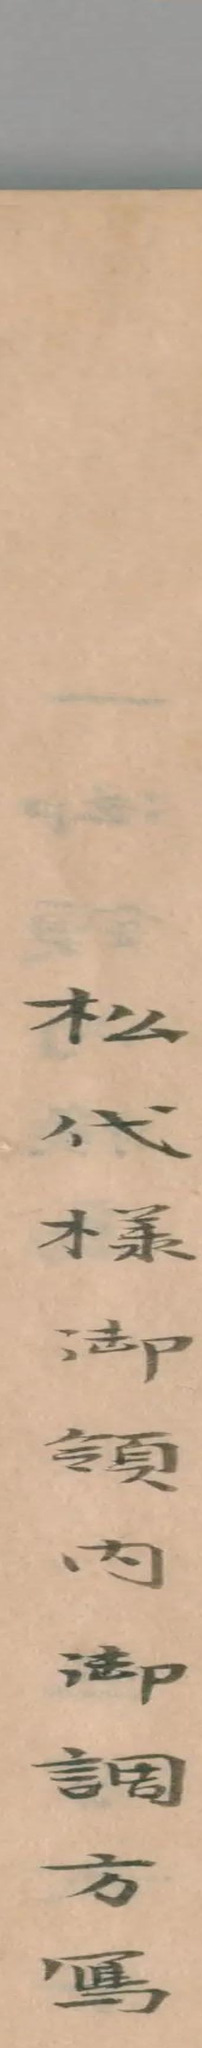松代様御領内御調方写
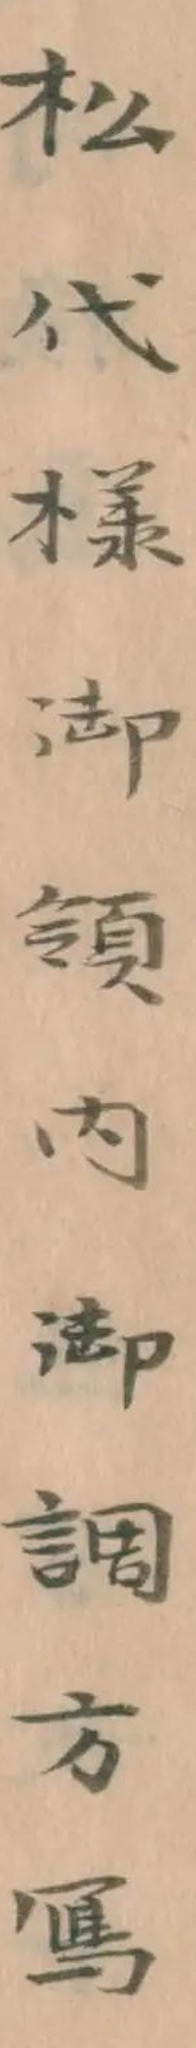松代様御領内御調方写

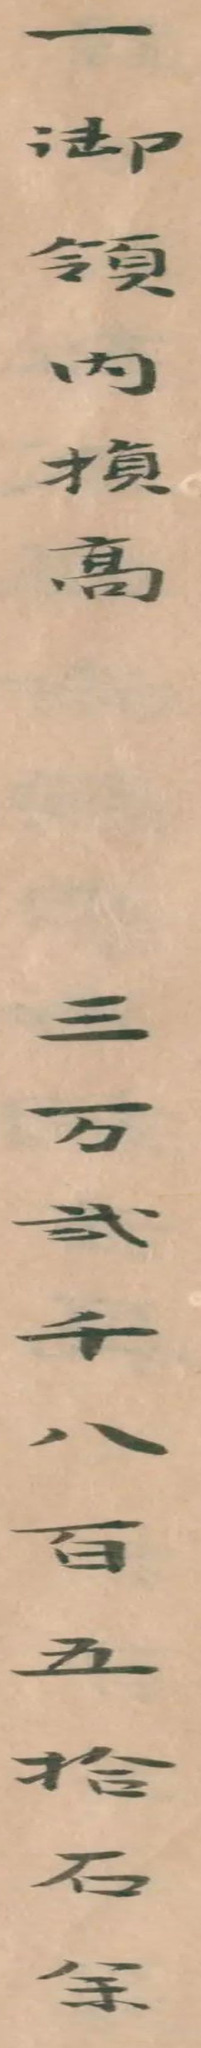一御領内損高三万弐千八百五拾石余
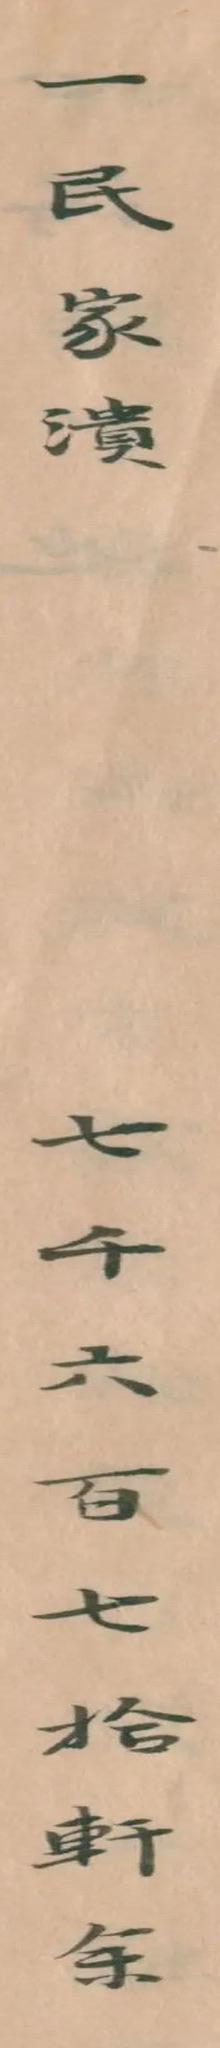一民家潰七千六百七拾軒余
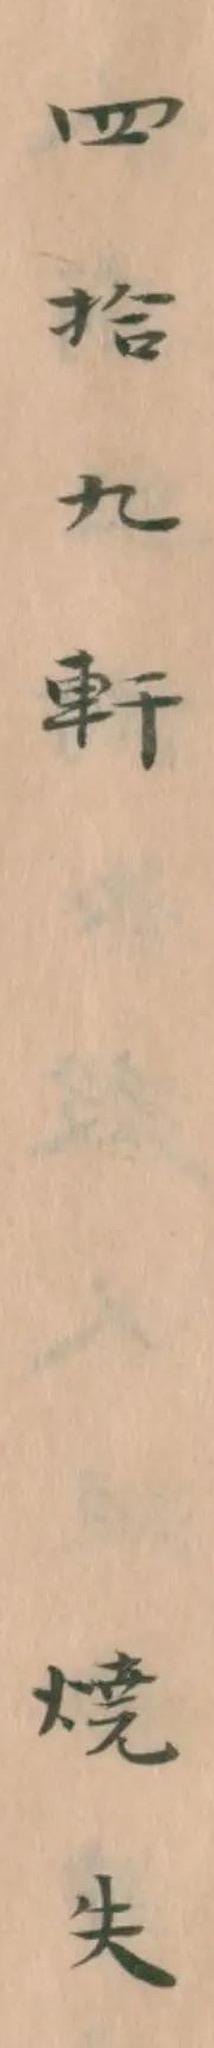四拾九軒焼失
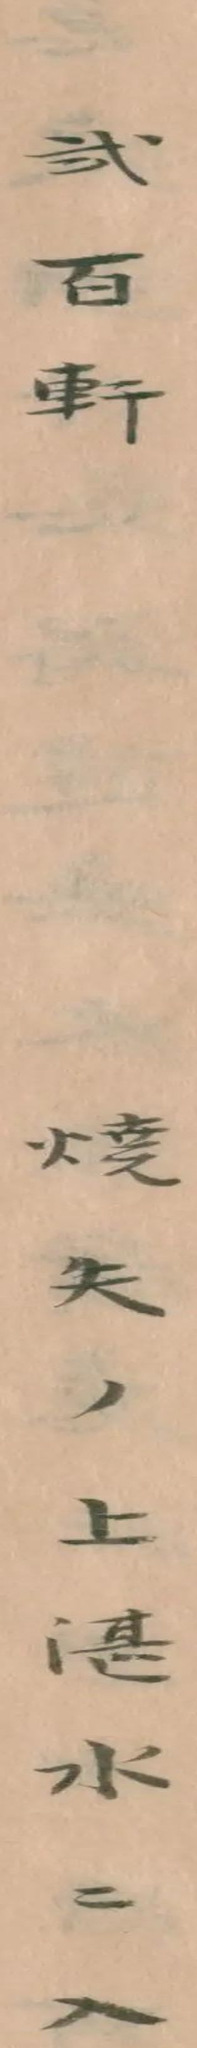弐百軒焼失ノ上湛水ニ入
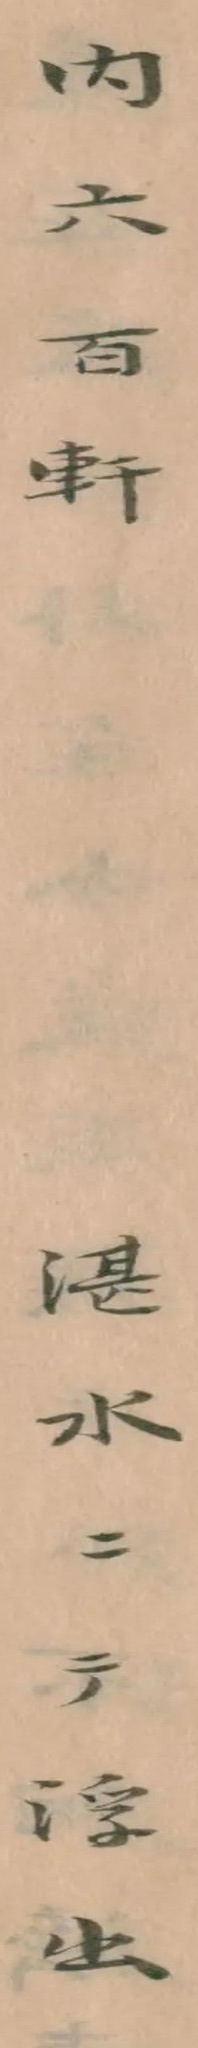内六百軒湛水ニテ浮出
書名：地災撮要. 巻5-6(地震之部)
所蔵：国立国会図書館 National Diet Library, JAPAN
